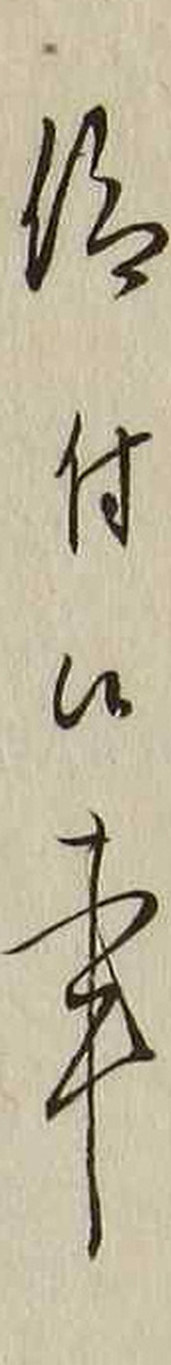仰付候事
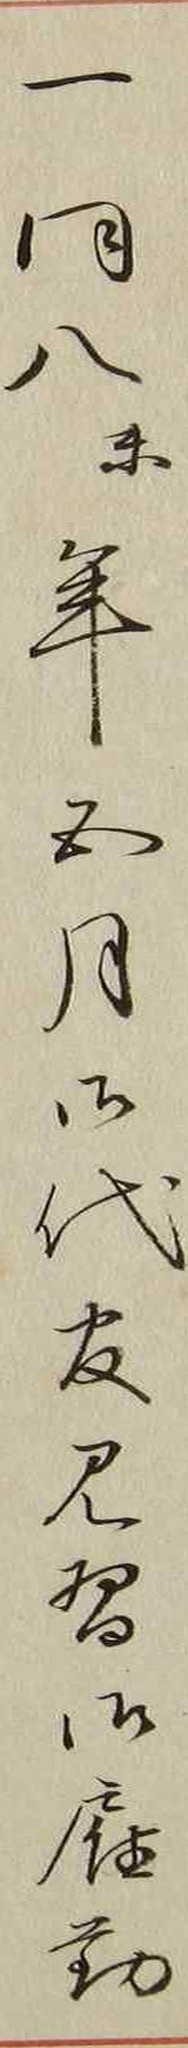一同八未年五月御代官見習御雇勤
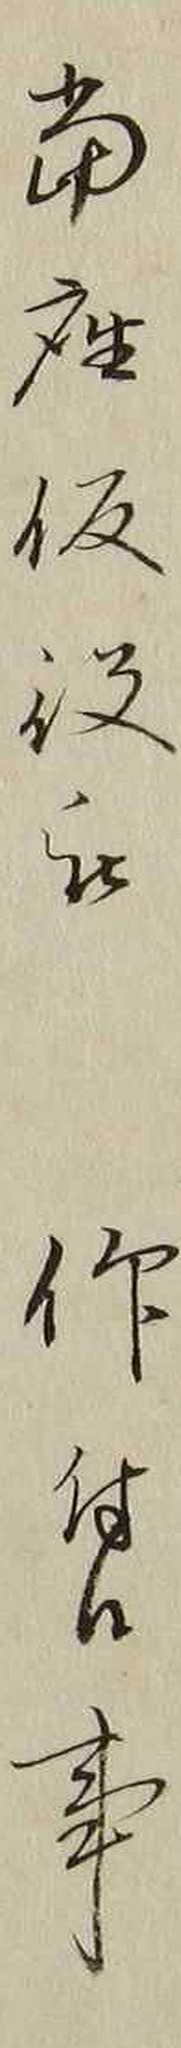当座仮役被仰付候事
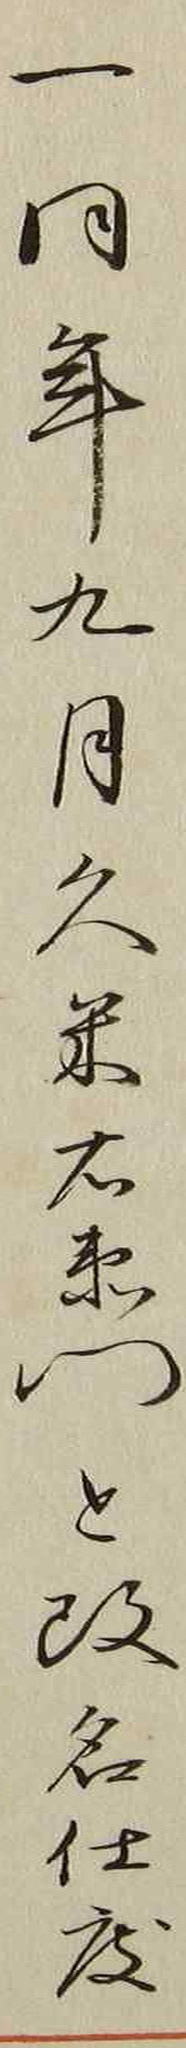一同年九月久米右衛門と改名仕度
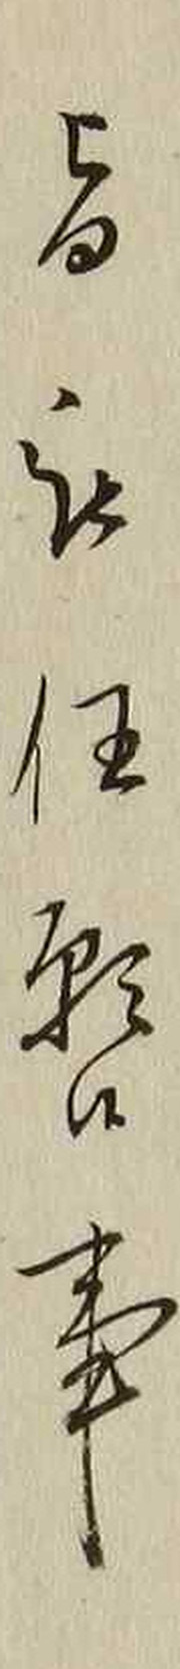旨被任願候事
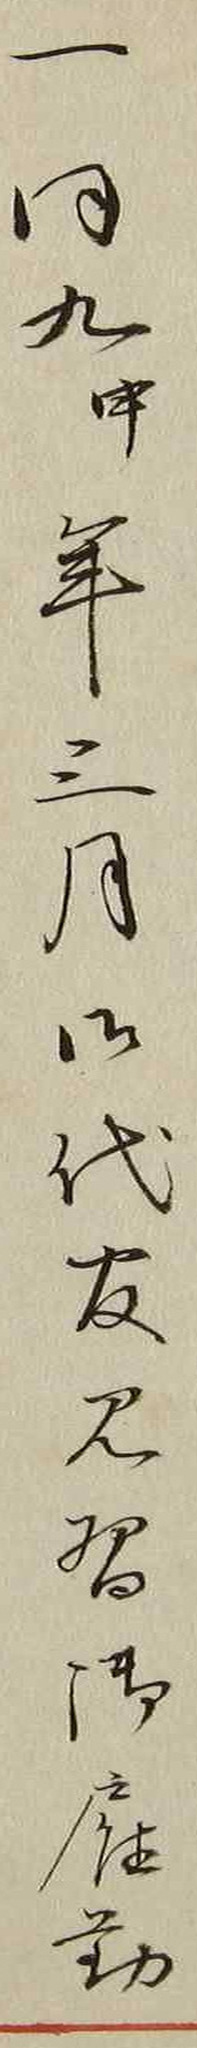一同九申年三月御代官見習御雇勤
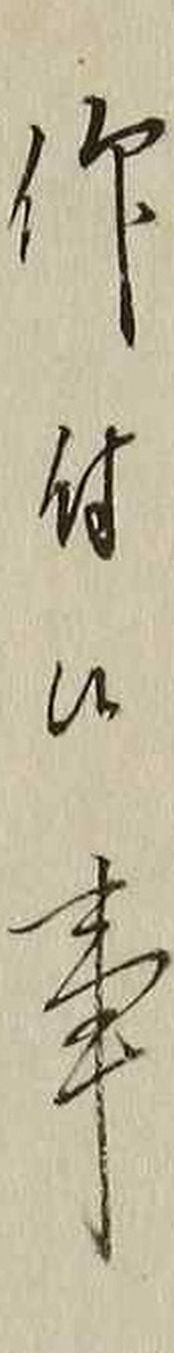仰付候事
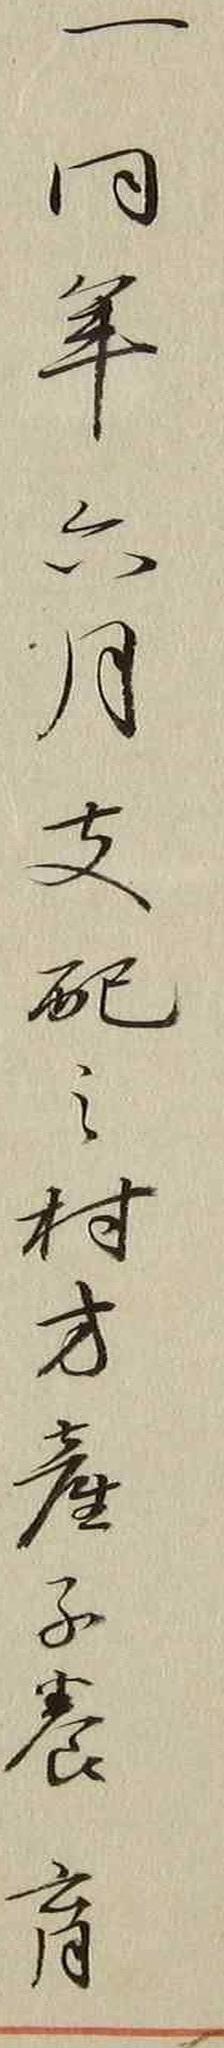一同年六月支配之村方産子養育
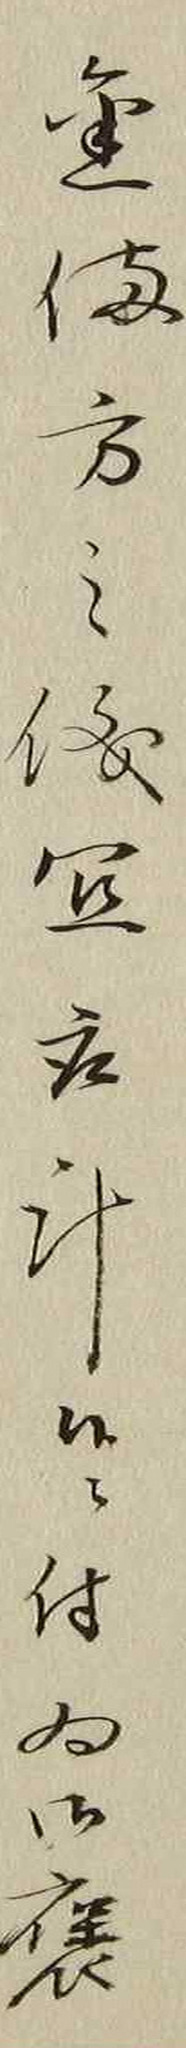金備方之儀宜取計候ニ付為御褒
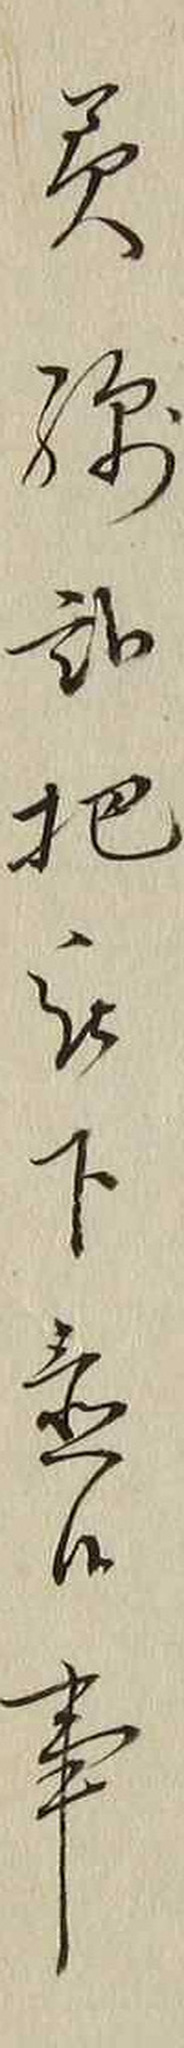美綿弐把被下置候事
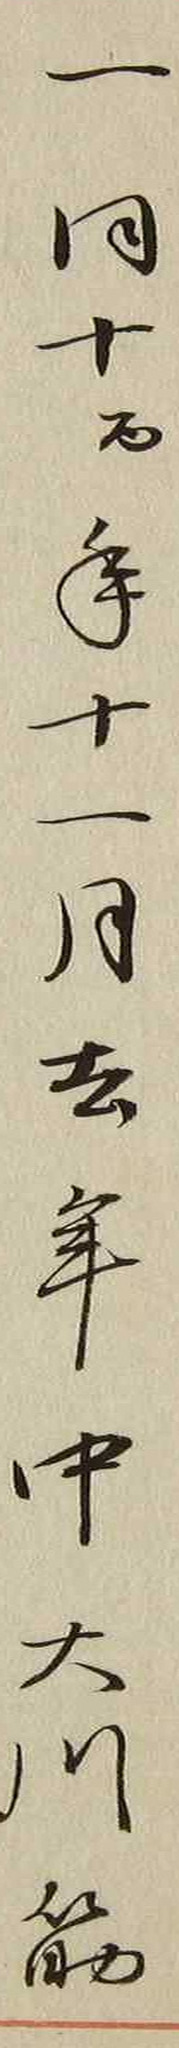一同十酉年十一月去年中大川筋
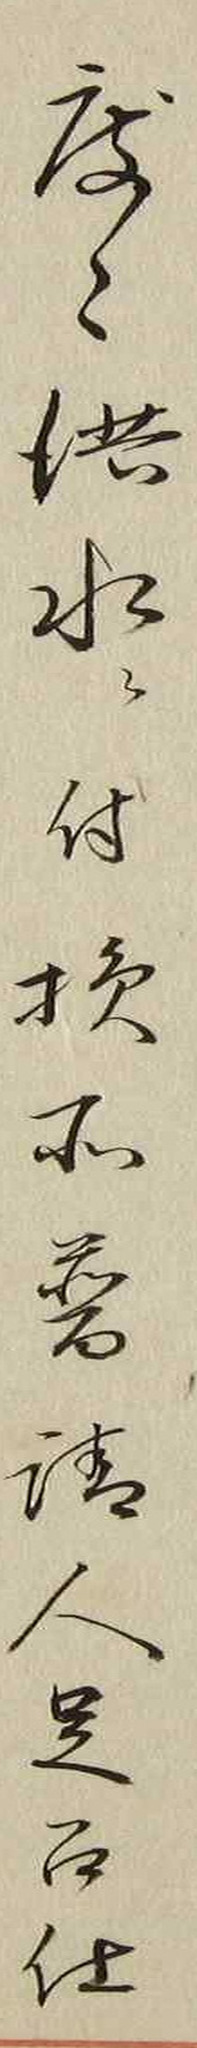度々洪水ニ付損所普請人足召仕
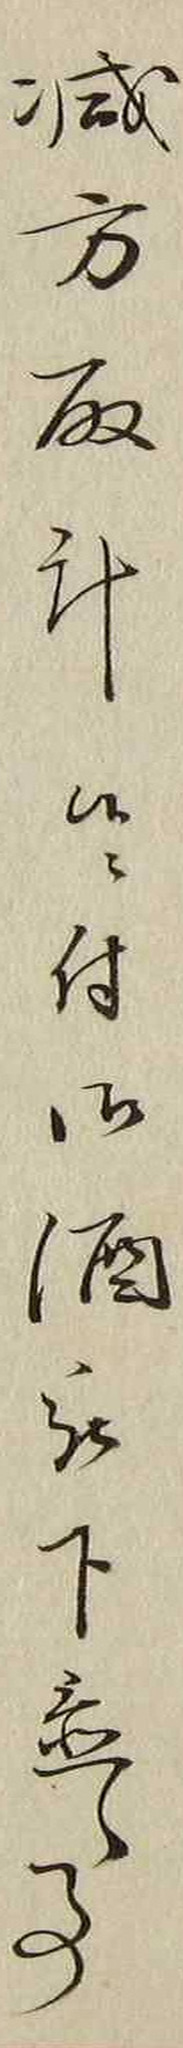減方取計候ニ付御酒被下置候事
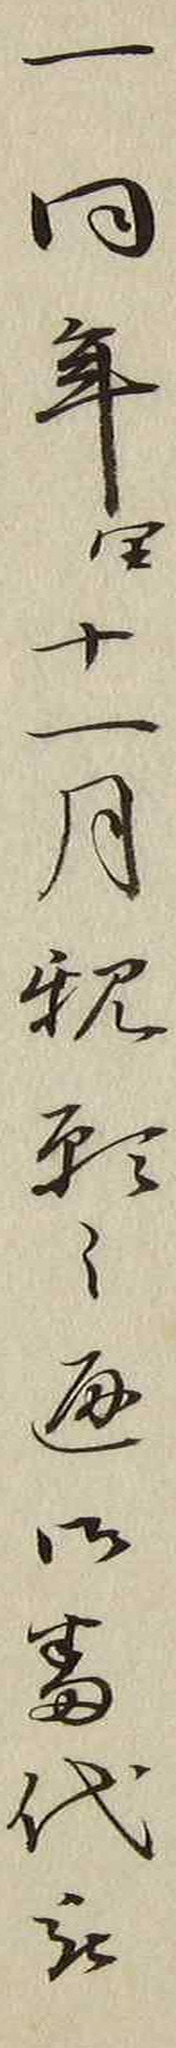一同年閏十一月親願之通御番代被
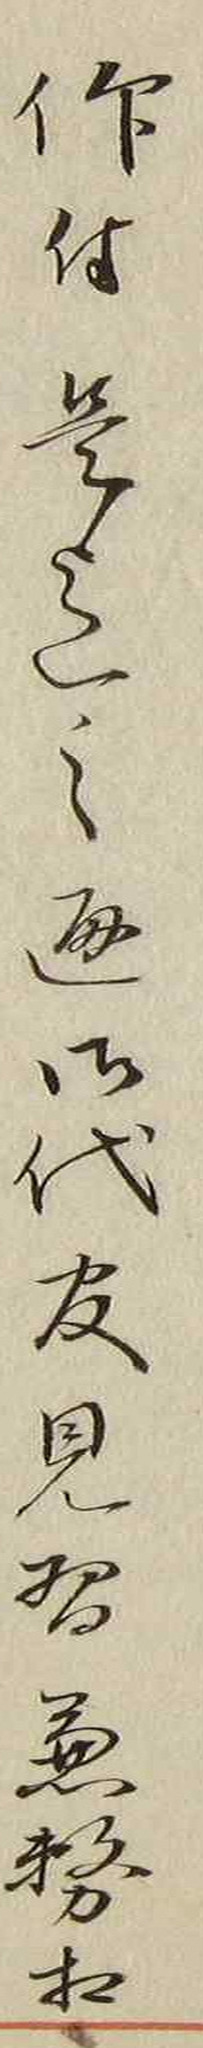仰付是迄之通御代官見習兼務相
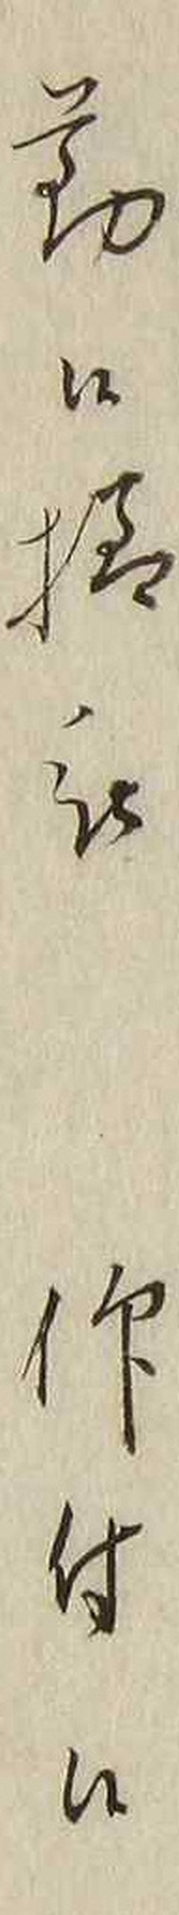勤候様被仰付候
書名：諸士系譜　巻之22　い之部22
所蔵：会津若松市立会津図書館
